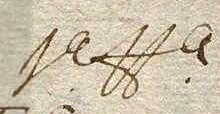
1.a tta.
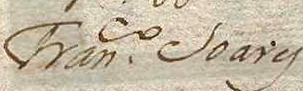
Fran.co Soares
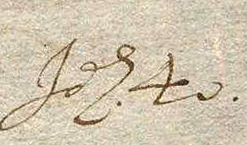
Jde. 40.
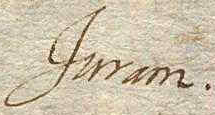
Juram.
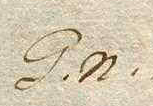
G.n.
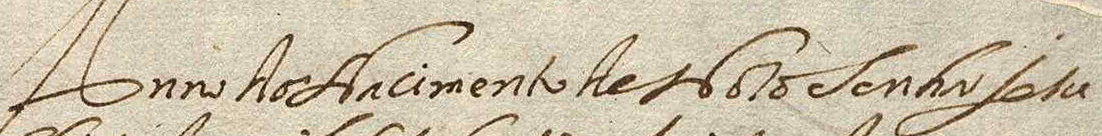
Anno do Nacimento de Noso Senhor Jesu
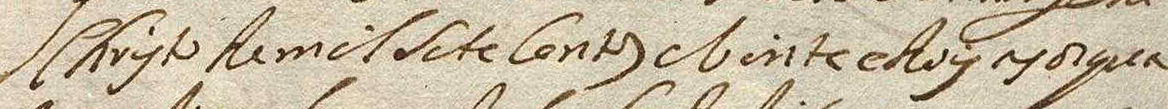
Christo de mil seteCentos e Vinte e dois as os qua
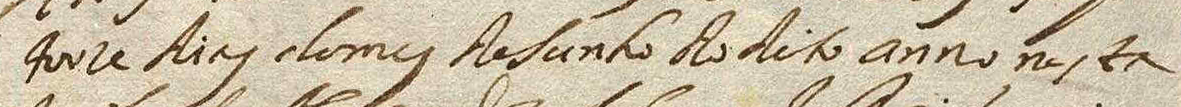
torze dias do mes de Iunho do dito anno nesta
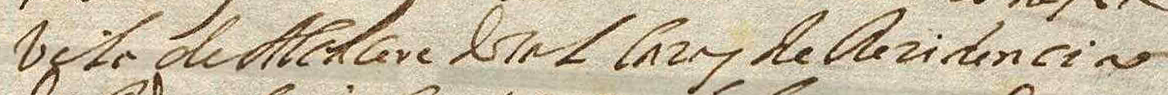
vila de Alcacere do Sal Cazas de Rezidencia
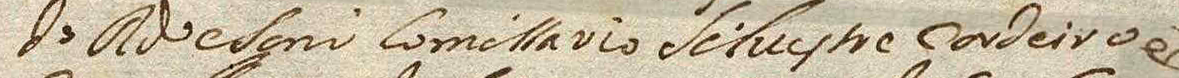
do Rdo e Sonr Comissario Siluestre cordeiro e
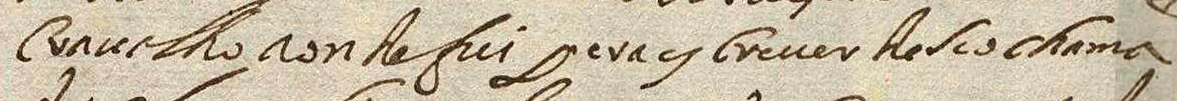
Craualho aonde fui pera escreuer de seo chama
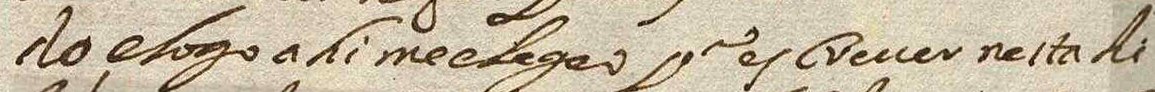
do e logo ahi me elegeo pa escreuer nesta di
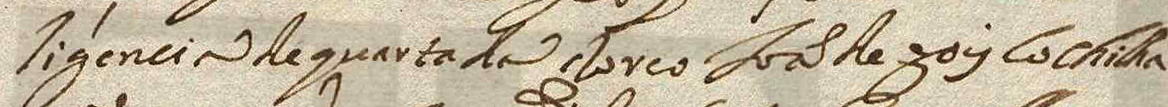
ligencia de quartada do reo Joã de gois Cochilha
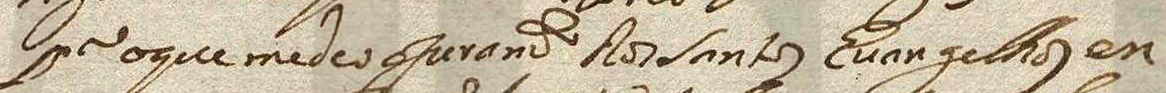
pa o que me deo o juramto dos Santos Euangelhos en
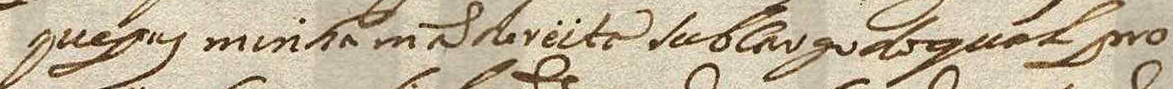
que pus minha mã dereita sub Cargo do qual pro
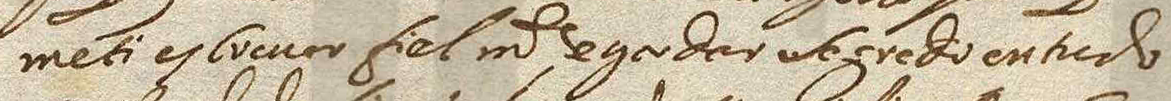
meti esCreuer fielmte, e gardar Segredo en tudo
